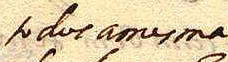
todos a mesma
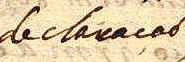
declaraçaõ
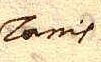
Tanis
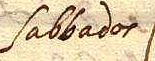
sabbados
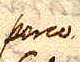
porco
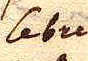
lebre
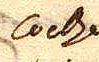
coelho
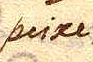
peixe
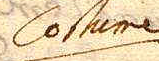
Costume
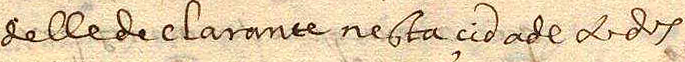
delle declarante nesta cidade todos
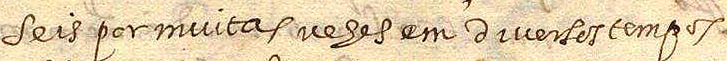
seis por muitas uezes em diuersos tempos
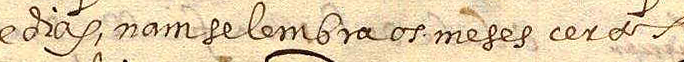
e dias, nam se lembra os meses certos
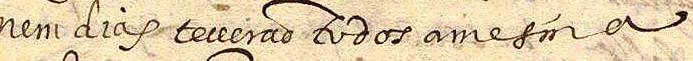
nem dias teuerão todos a mesma
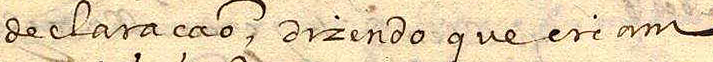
declaraçaõ dizendo que criam
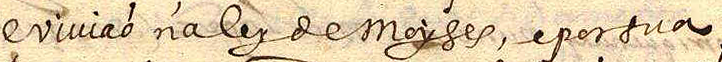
e viuiaõ na ley de moyses, e por sua
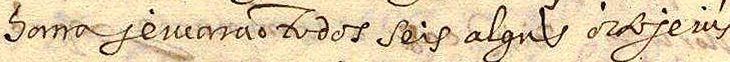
honra jeiuaraõ todos seis algūs oito jeiūs
